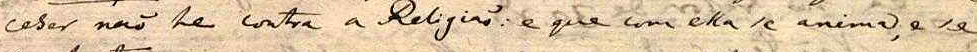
ceber naõ he contra a Religiaõ: e que com ella se anima, e se
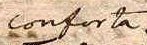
conforta.
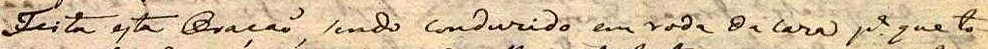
Feita esta Oraçaõ, sendo conduzido em roda de caza p.a que to
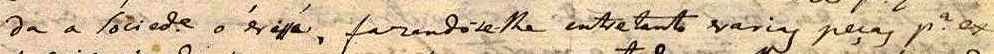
da a socied.e o visse, fazendo-se-lhe entretanto varias peças p.a ex
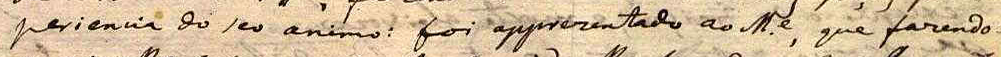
periencia do seo animo: foi apprezentado ao M.e, que fazendo
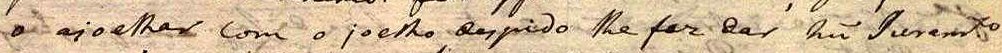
o ajoelhar com o joelho despido lhe fez dar hū Iuram.to
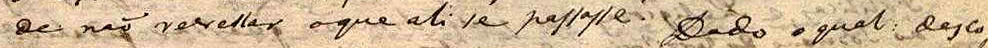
de naõ revellar o que ali se passasse. Dado o qual: desco
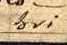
bri
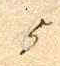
5
